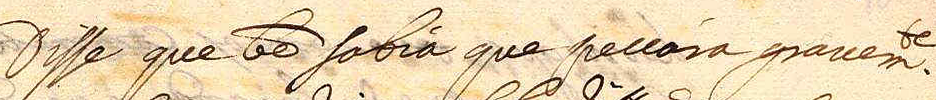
Disse que bē sabia que peccara grauemte
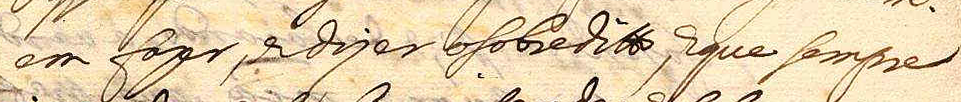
em fazer, E dizer o sobreditto, E que sempre
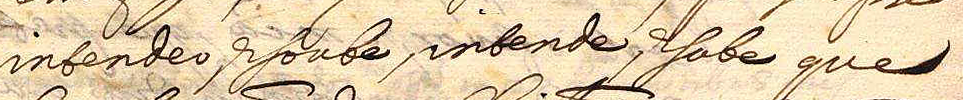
intendeo, E soube, intende, E sabe que
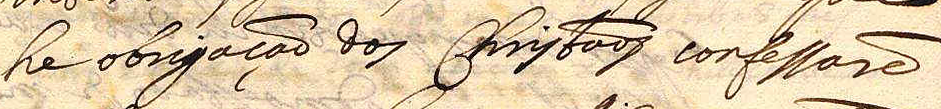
he obrigação dos Christãos confessarē
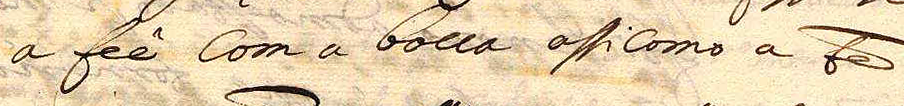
a feé com a bocca assi como a tē
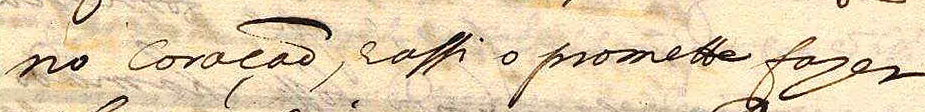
no coração, E assi o prometteo fazer
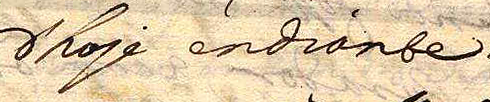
d'hoje en diante
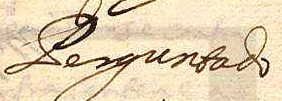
Perguntado
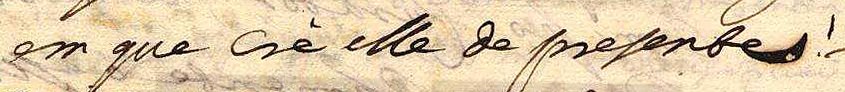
em que cre elle de presente?
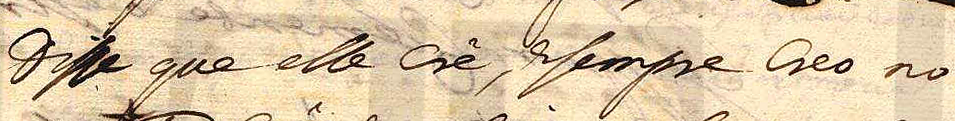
Disse que elle crê, E sempre creo no
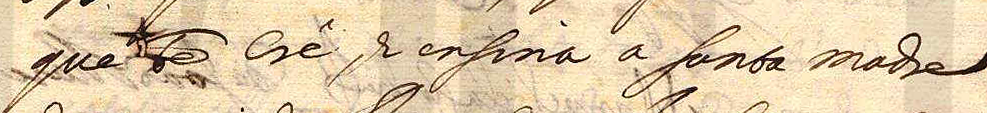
que tē crê, E ensina a santa madre
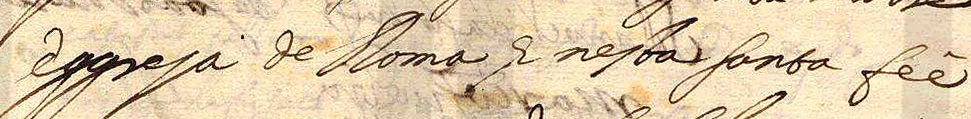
eggreja de Roma, E nesta santa feé
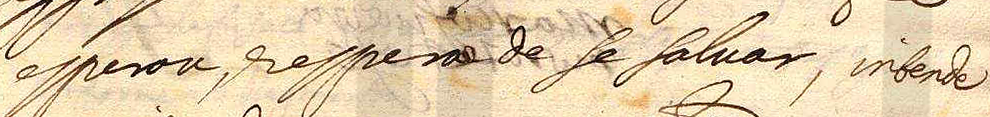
esperou, E espera de se saluar intende
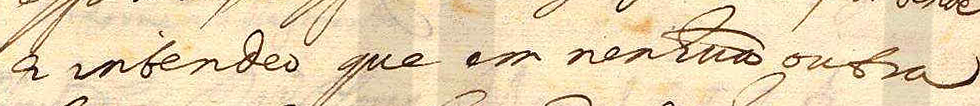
E intendeo que em nenhuā outra
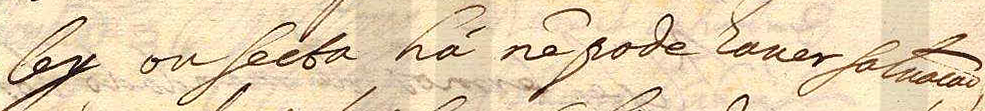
ley ou secta há nē pode hauer saluação
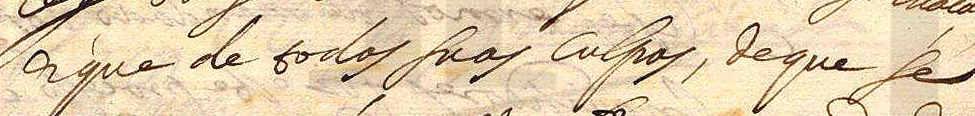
E que de todas suas culpas, de que se
